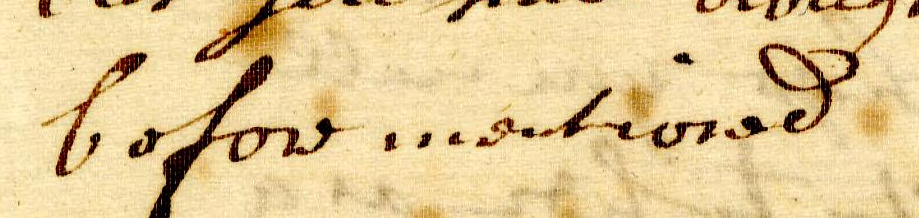before mentioned
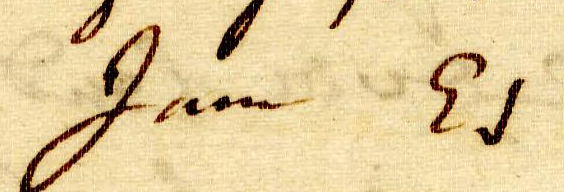I am ES
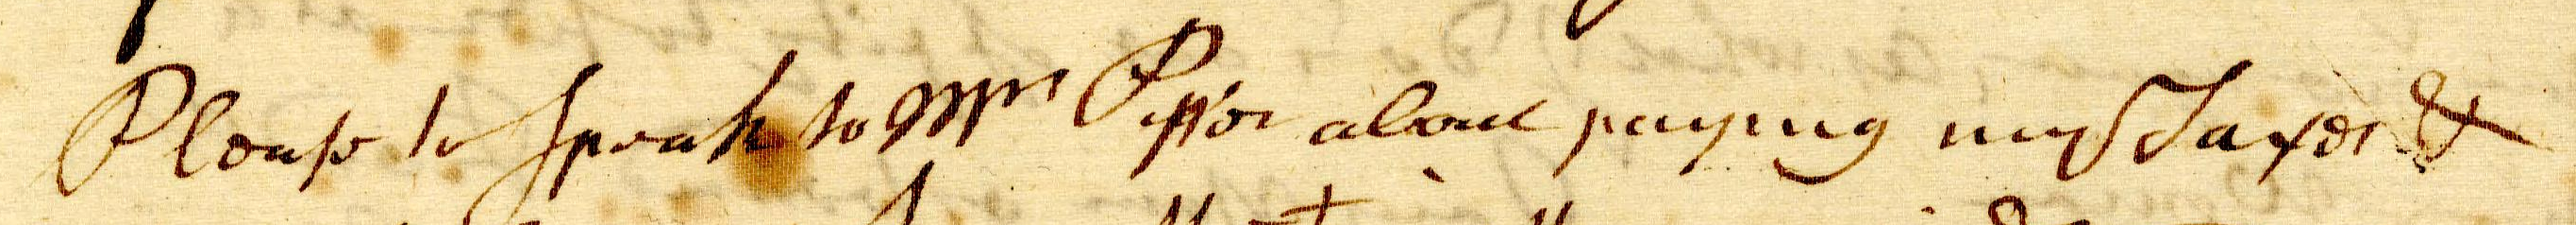Please to speak to M^r Piper about paying my Taxes &
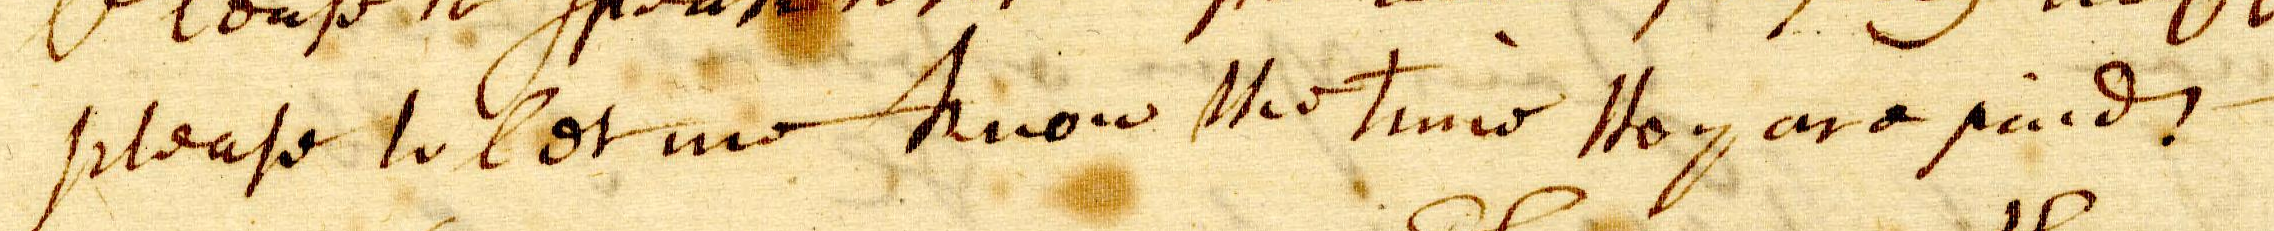please to let me know the time they are paid.
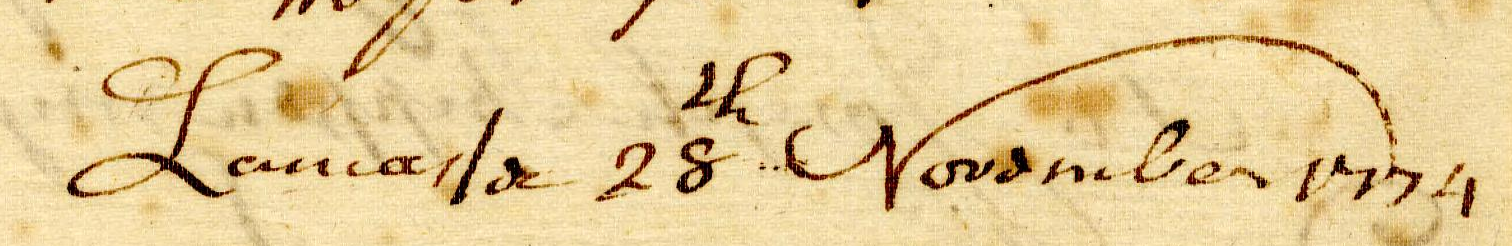Lancaster 28^th November 1774
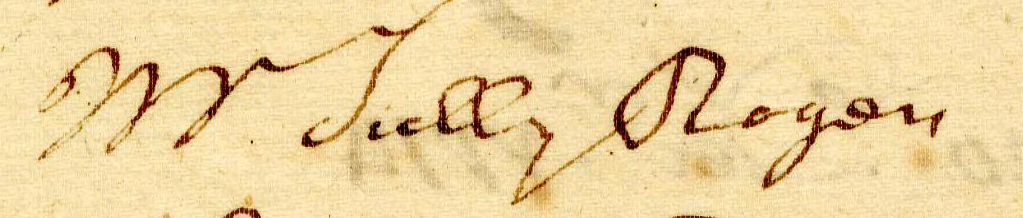M^r Sully Rogers
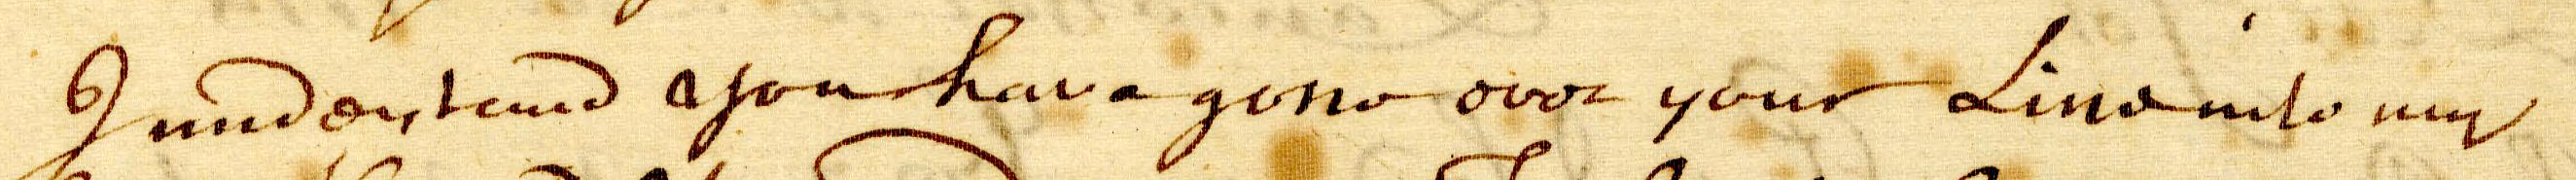I understand you have gone over your Line into my
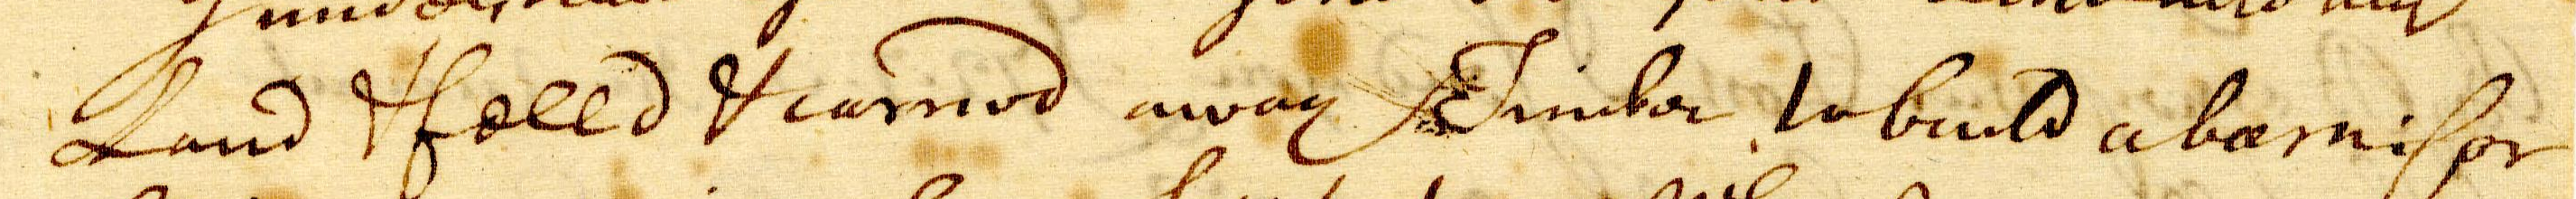Land & felld & carried away Timber to build a barn for
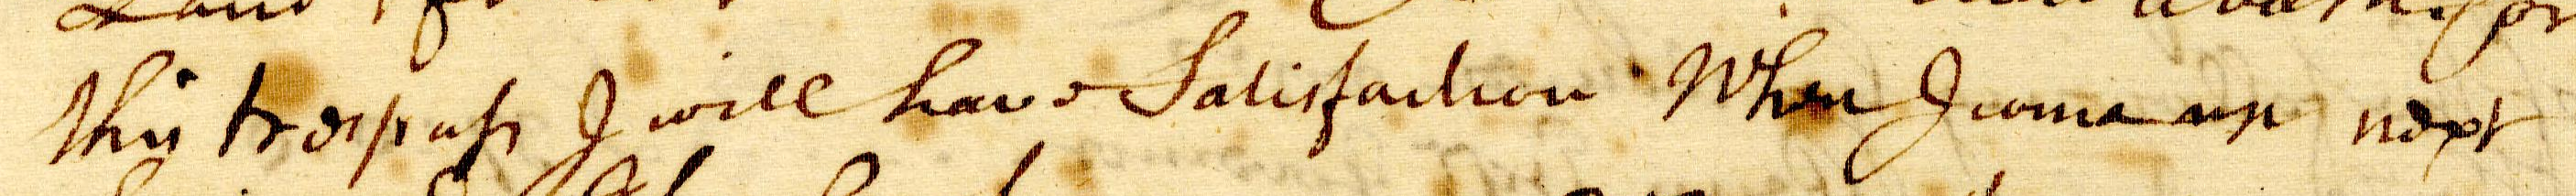his horses I will have Satisfaction When I come up next
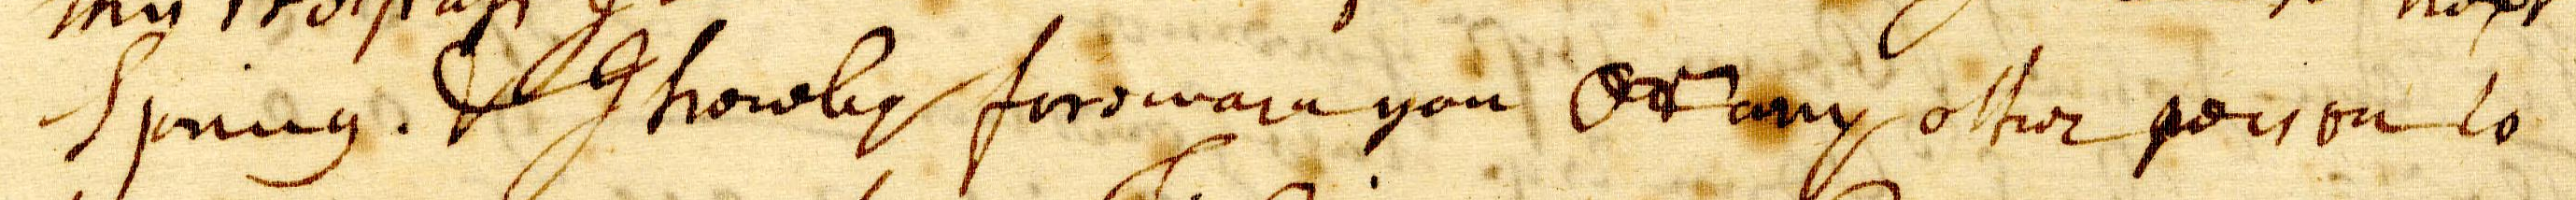Spring. & I hereby forewarn you Of any other person to
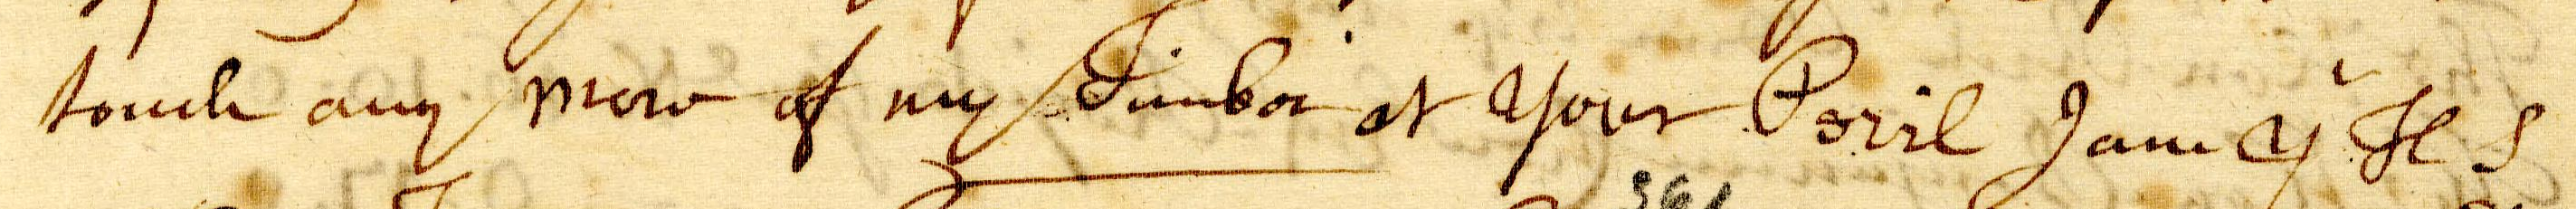touch any more of my Timber at Your Peril I am y^e H S
